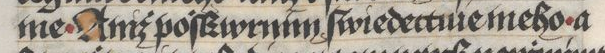me.Aniż poẛkwrnim ſwiedectuie meho.a
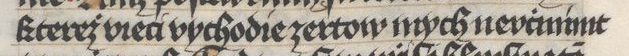ktereż vieci vychodie zertow mych nevċinimt
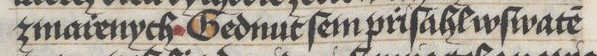zmaṙenych.Sednut ſem pṙiſahl vſwatē
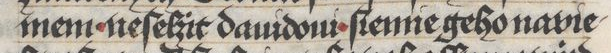mem.neſelżit dauidoui.ſiemie geho navie¬
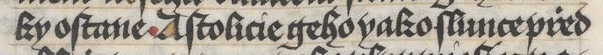ky oſtane.Aſtolicie geho yako ſlunce pṙed
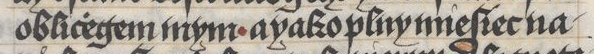obliċegem mym.a yako plny mieſiec na¬
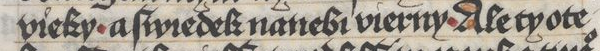vieky.a ſwiedek nanebi vierny.Ale ty ote¬
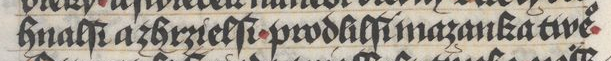hnalſi a zhrzielſi.prodlilſi mazanka tweo
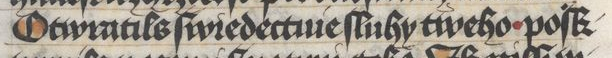Otwratils ſwiedectuie ſluhy tweho.poẛk¬
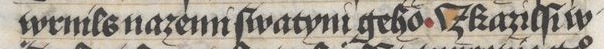wrnils nazemi ſwatyni geho.Zkazilſi w¬
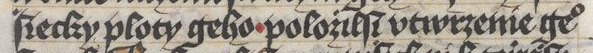ẛiecky ploty geho.polożilſi vtwrzenie geo
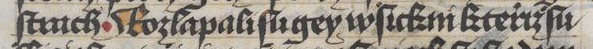ſtrach.Rozlapali ſu gey wẛickni kteṙiż ſu
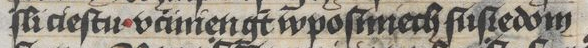ẛli cieſtu.vċinien ḡt wpoſmiech ſuſiedom
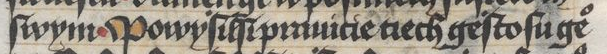ſwym.Powyẛilſi prauicie tiech geẛto ſu geo
